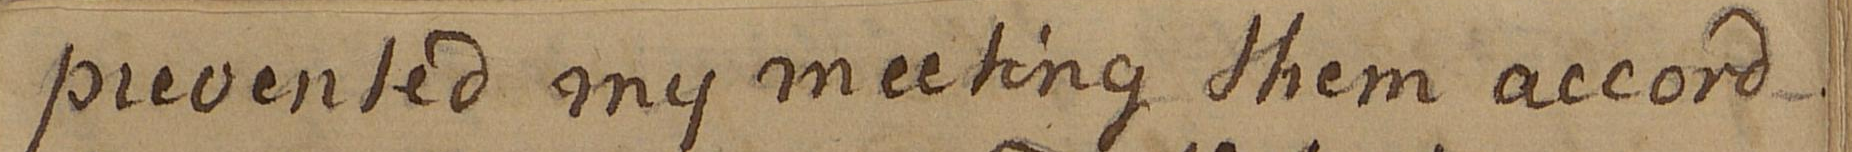prevented my meeting them accord
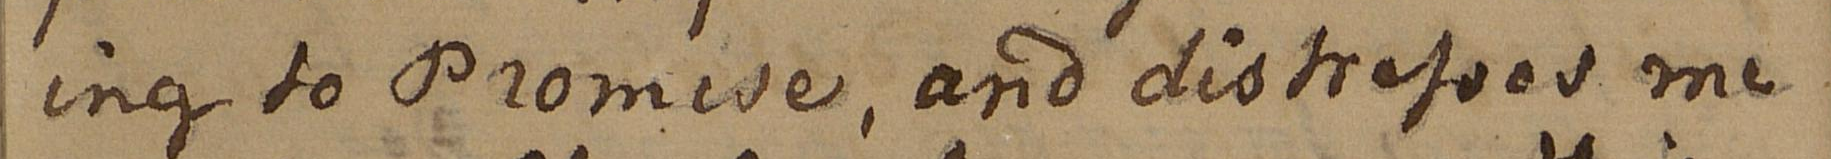ing to Promise, and distresses me
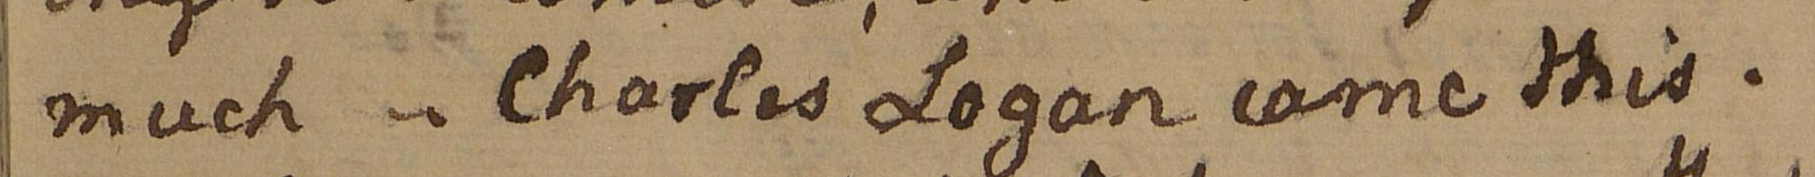much- Charles Logan came this.
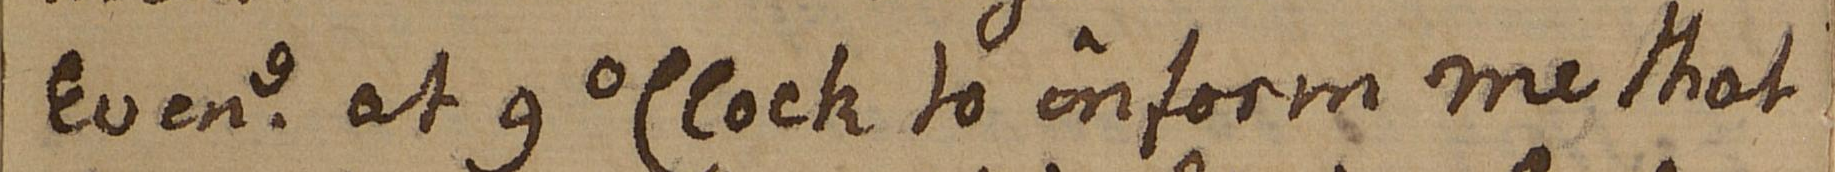Even^g. at 9 ^o Clock to inform me that
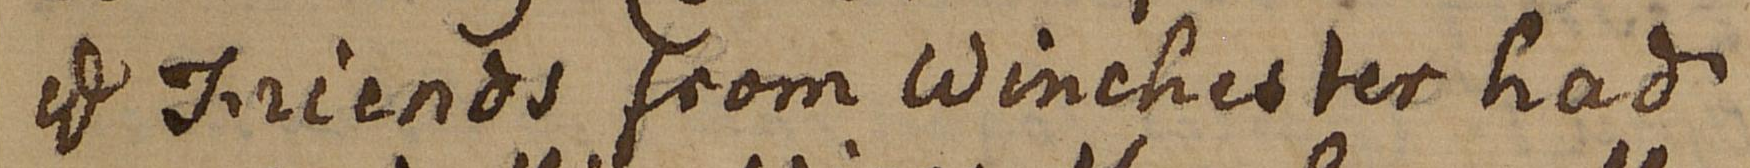y^e Friends from Winchester had
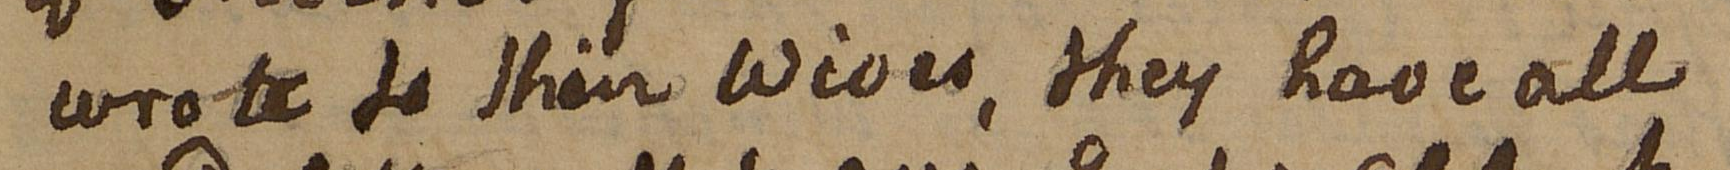wrote to their Wives, they have all
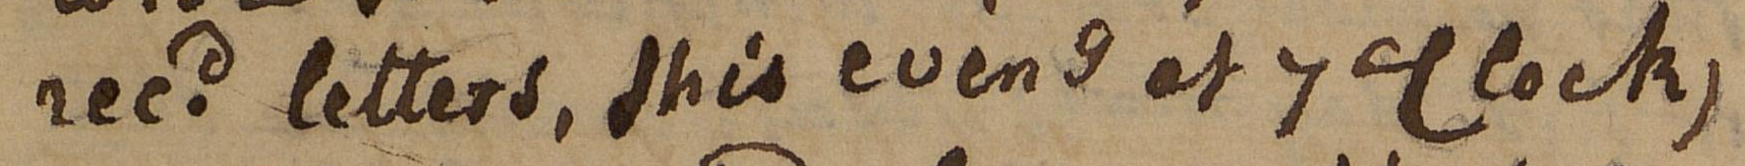rec^d. letters, this even^g at 7 ^o Clock,
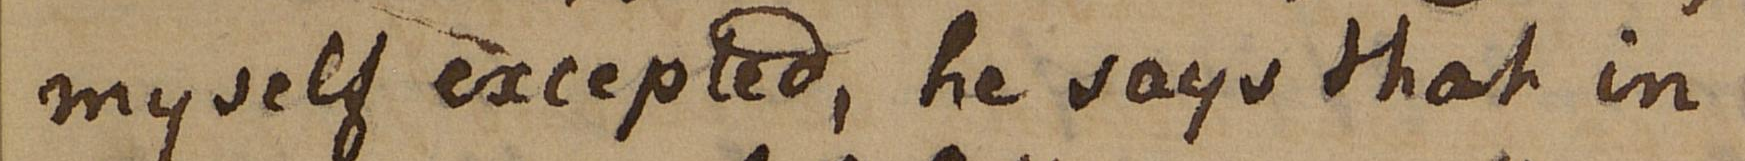myself excepted, he says that in
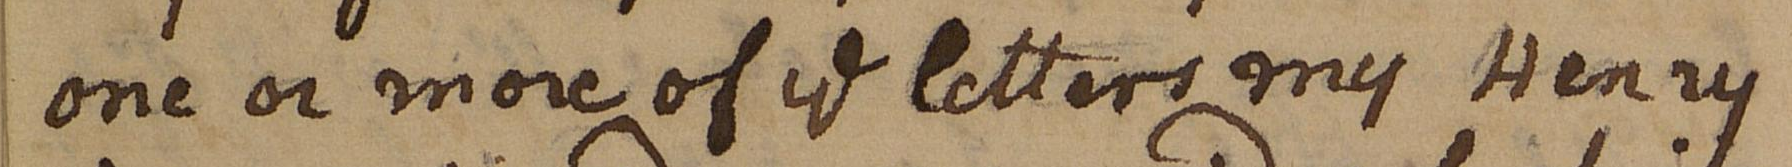one or more of y^e letters my Henry
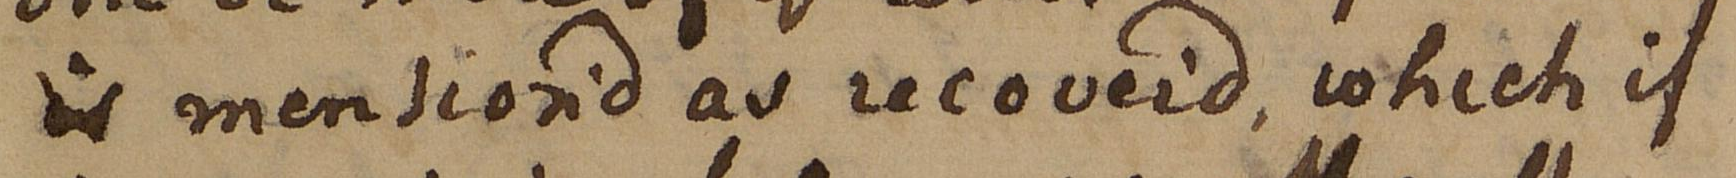is mention'd as recover'd, which if
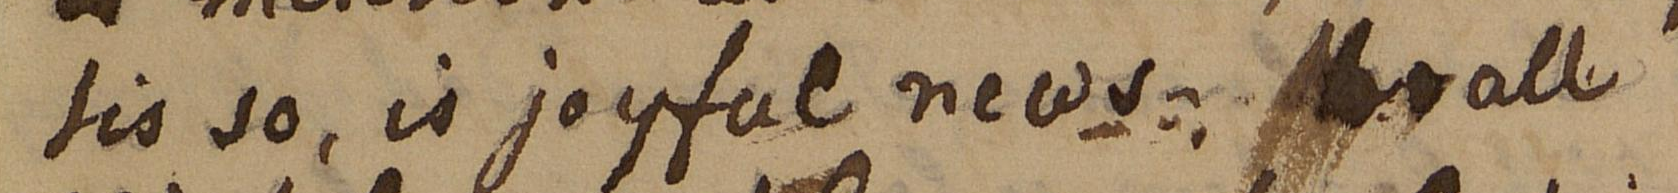tis so, is joyful news- We all
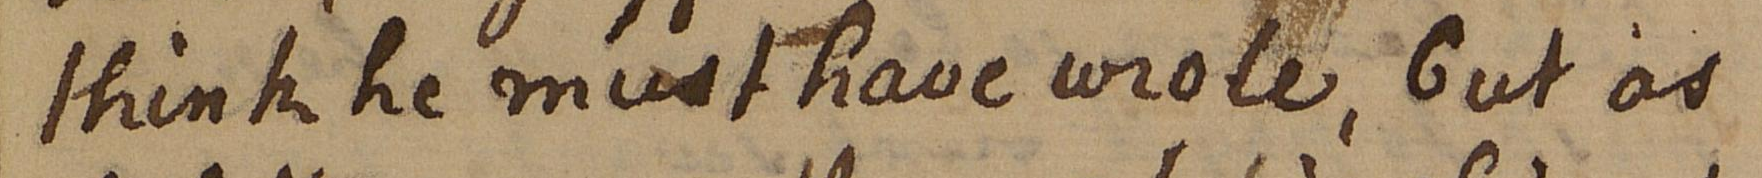think he must have wrote, but as
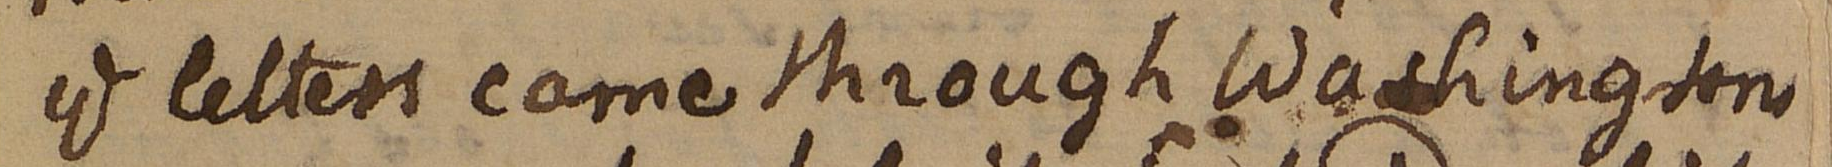y^e letters came through Washingtons
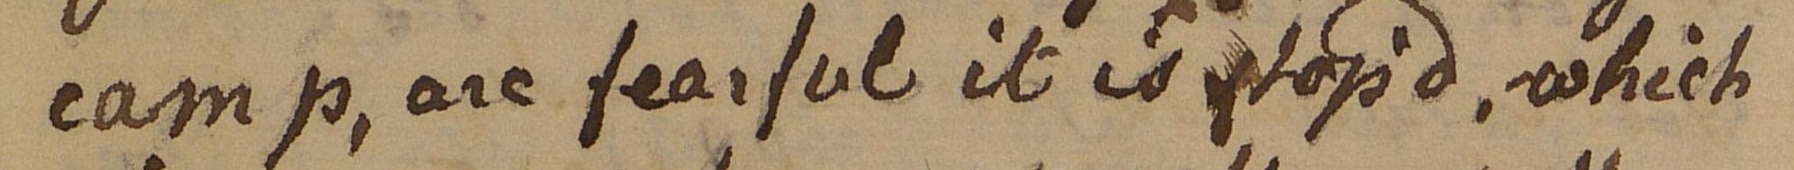camp, are fearful it is stop'd, which
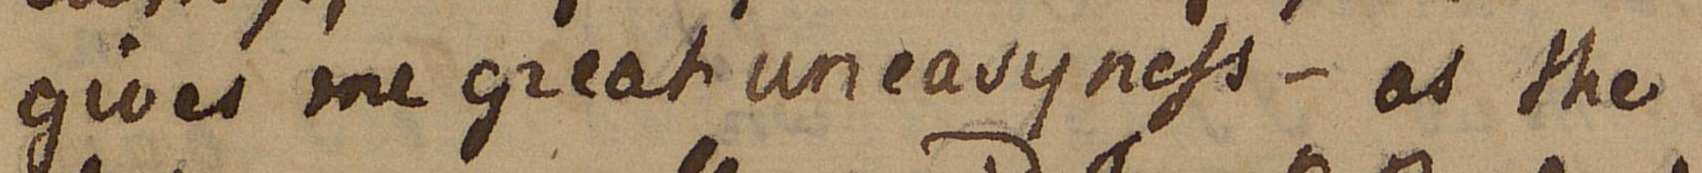gives me great uneasyness- as the
